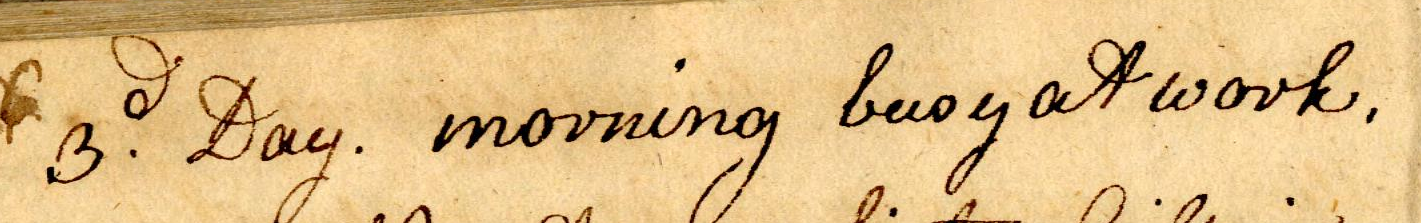3^d Day. morning busy at work,
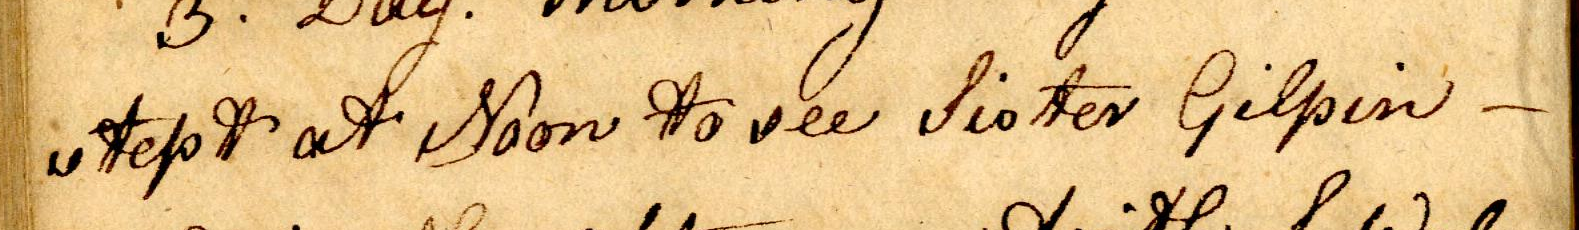stept at Noon to see Sister Gilpin-
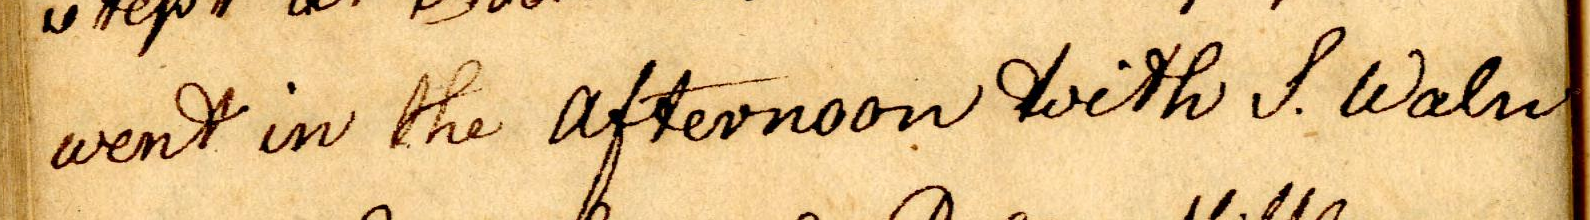went in the Afternoon with S. Waln
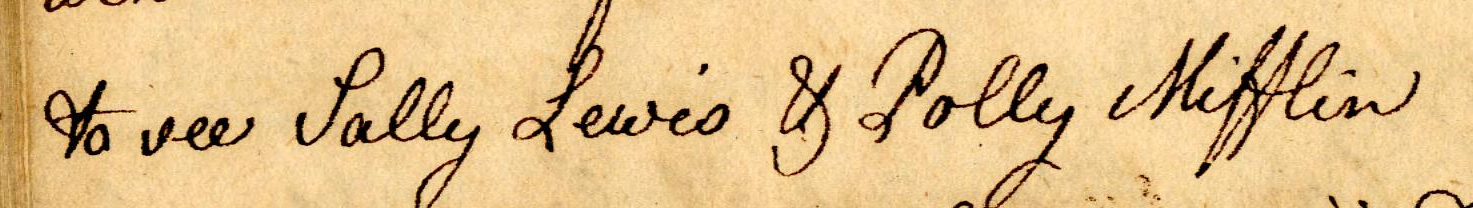to see Sally Lewis & Polly Mifflin
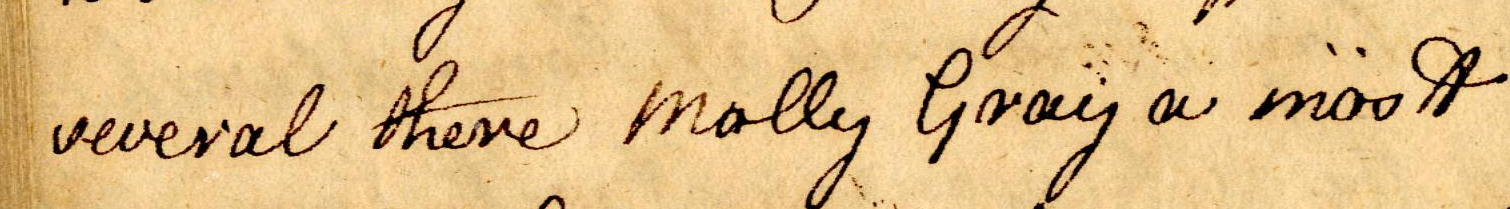several there Molly Gray a most
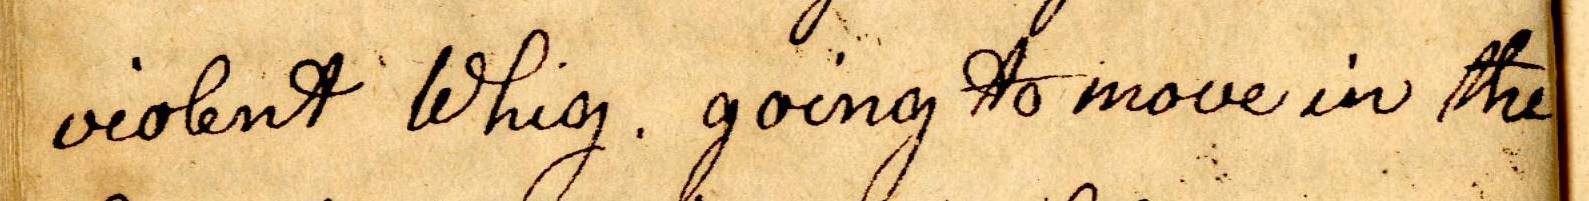violent Whig. going to move in the
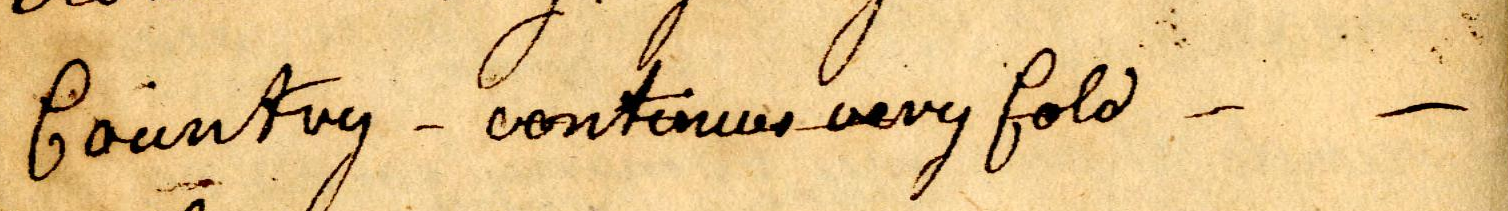Country- continues very Cold-
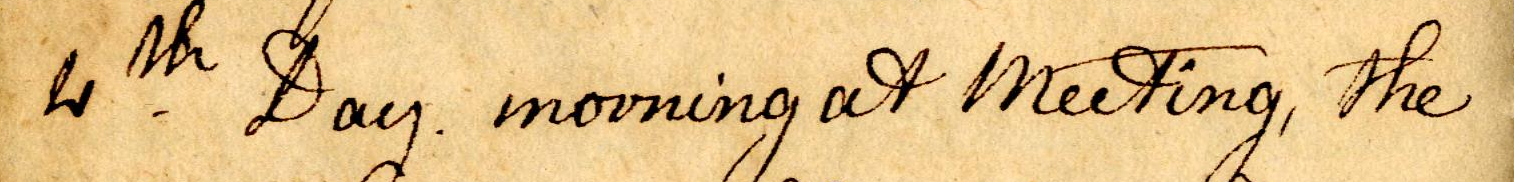4^th Day. morning at Meeting, the
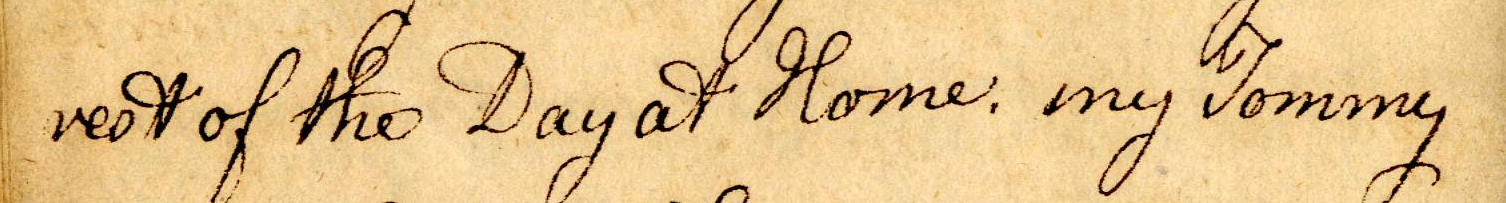rest of the Day at Home. my Tommy
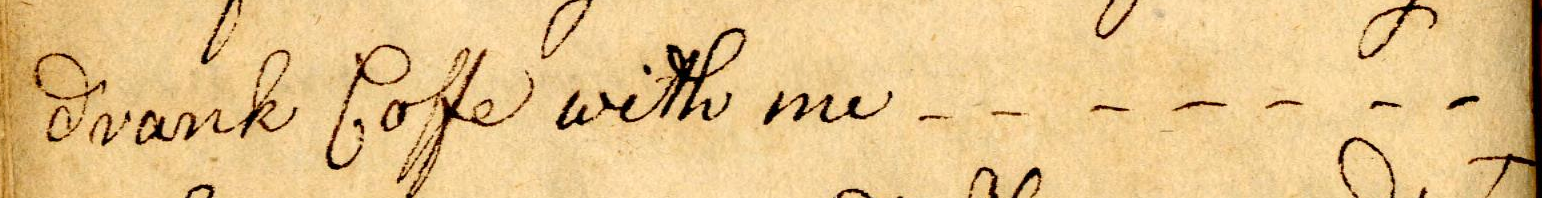drank Coffe with me-
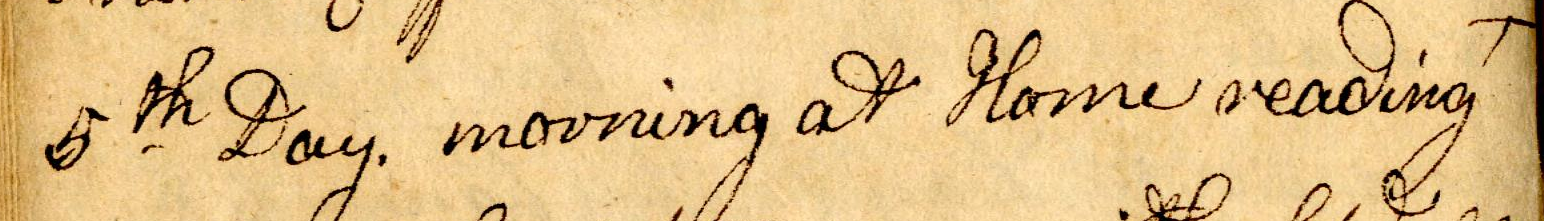5^th Day. morning at Home reading
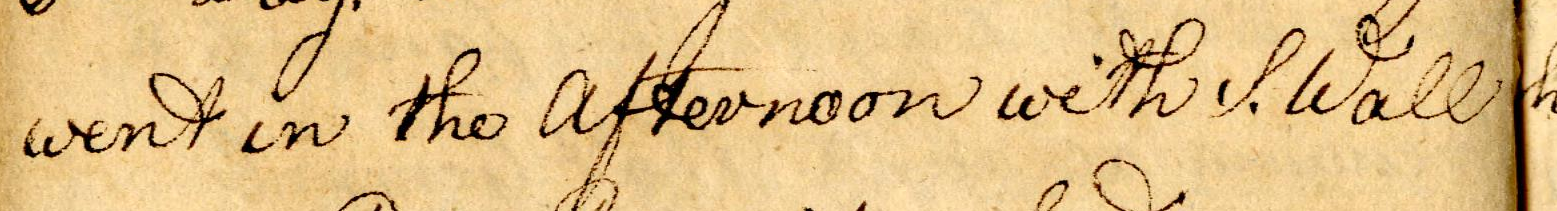went in the Afternoon with S. Wall
